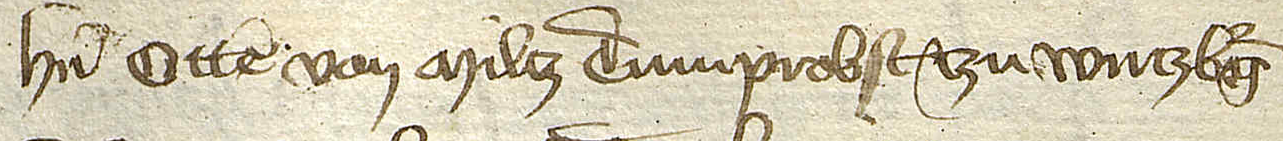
hn* Otte* von Milcʒ Tumprobſt* cʒu wircʒb*g
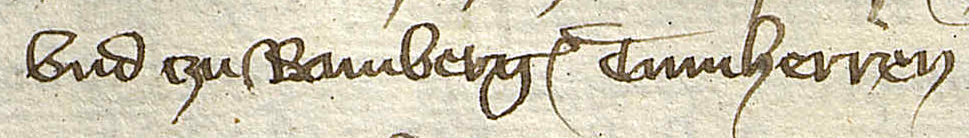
vnd cʒu Bamberg* Tumherren
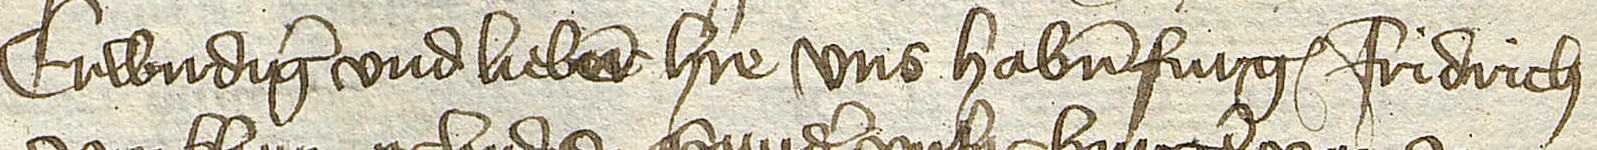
Erwirdig* vnd lieber h*re vns habn* fürg* Fridrich
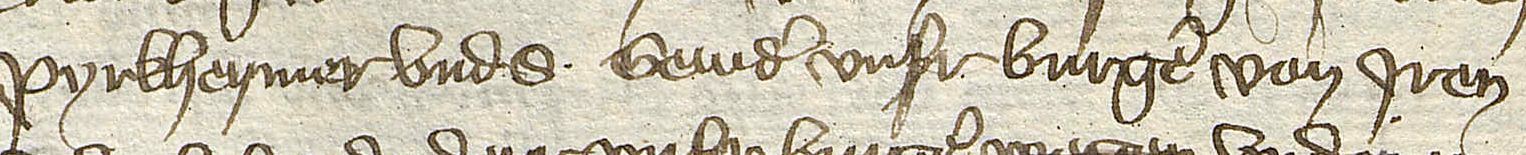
Pyrkheymer vnd S . Gewd* vnſ*r burge* von Iren
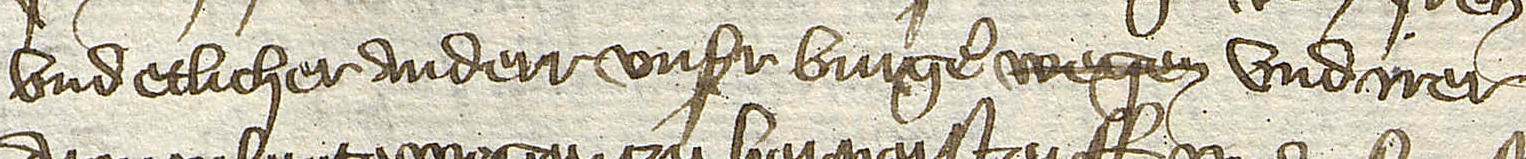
vnd etlicher Anderr vnſ* burge* wegen vnd irer
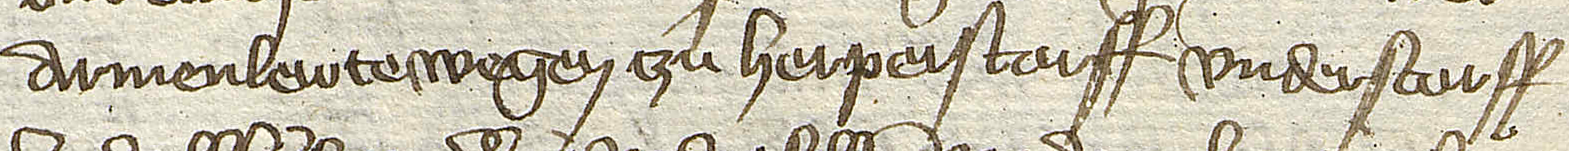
Armenlewte wegen cʒu herperſtorff vnderſtorff
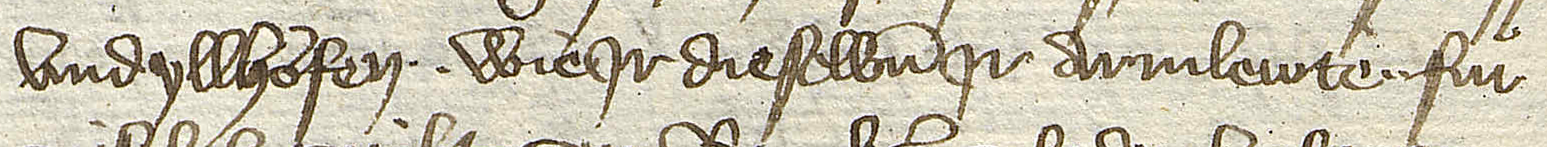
vnd yllhofen . . wie Ir dieſelbn* Ir Armlewte ~ für
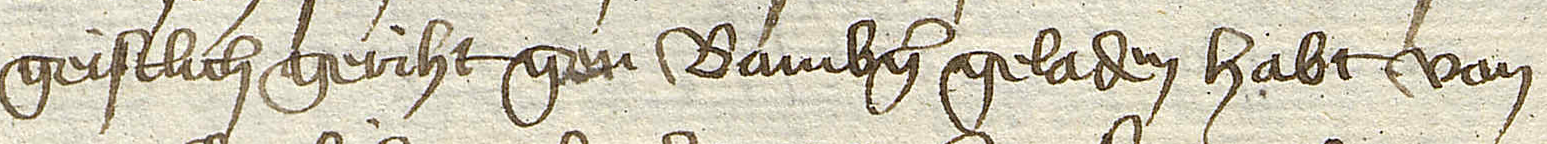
geiſtlich geriht gen Bambg* geladen habt von
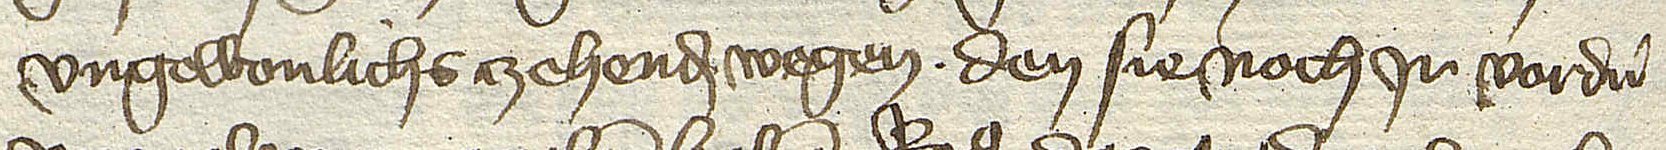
vngewonlichs cʒehend* wegen . den ſie noch Ir vordn*
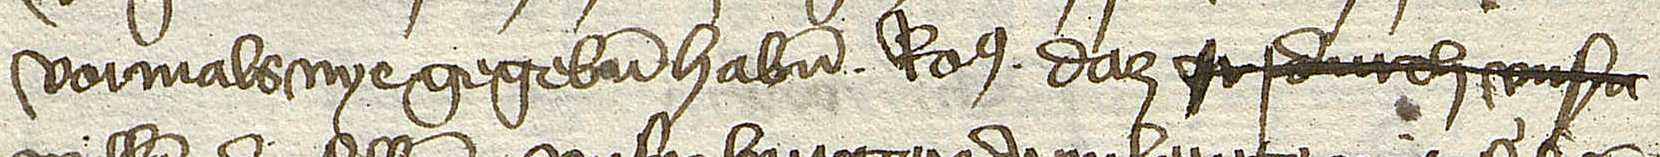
vormals nye gegebn* habn* . Ro* . daʒ Ir durch vnſ*n
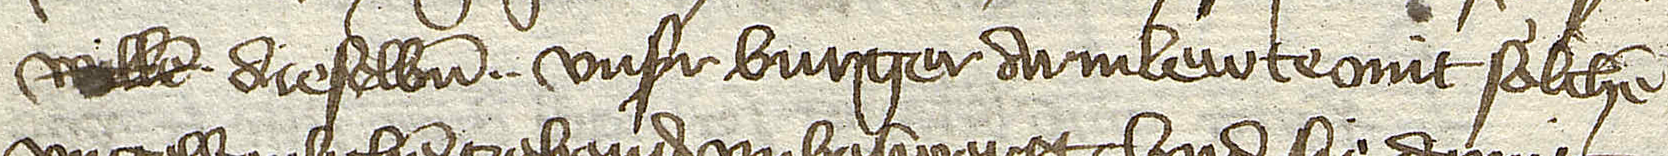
wille* . dieſelbn* ~ vnſ*r burger Armlewte mit ſöliche*
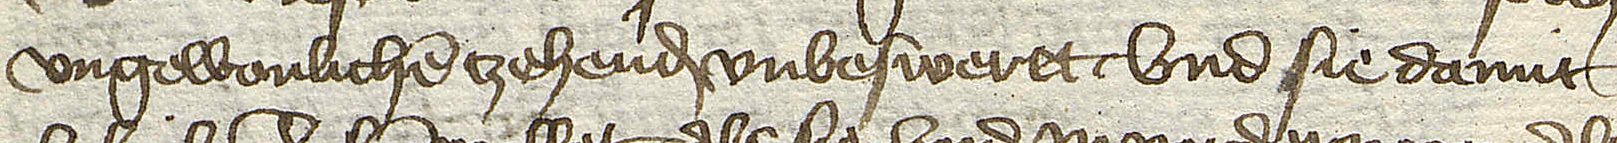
vngewonliche* cʒehend vnbeſweret / vnd ſie damit
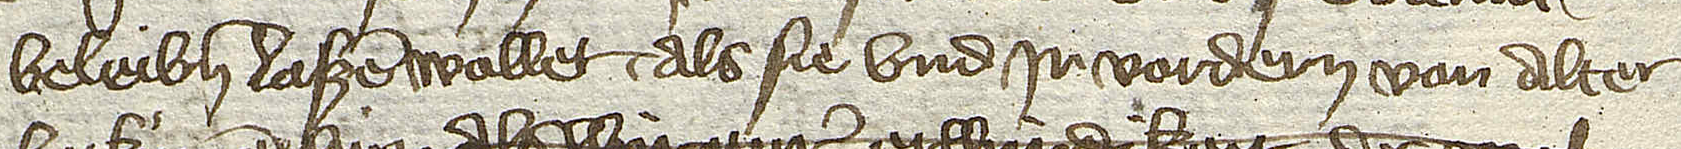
beleibn* laſʒe* wollet / Als ſie vnd Ir vordern von Alter
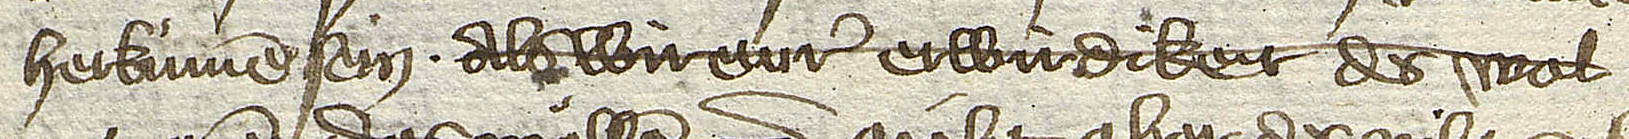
herküme* ſein . Als wir ewr* erwirdikeit des wol
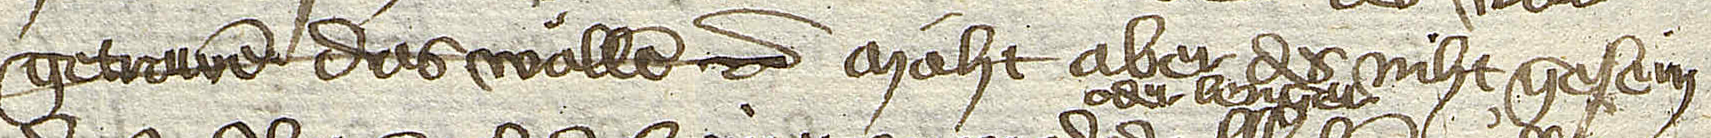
getrawe* das wölle ec* Möht aber des niht geſein
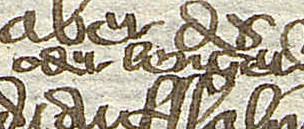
oder lenger
